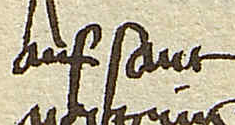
auf ſant
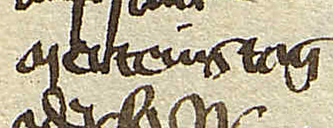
Merteins tag
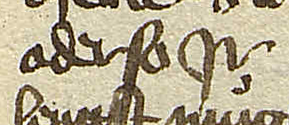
oder ſo Ir
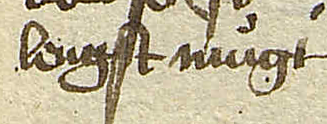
lengſt mügt
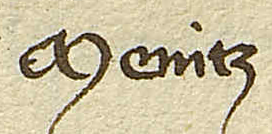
Meincʒ
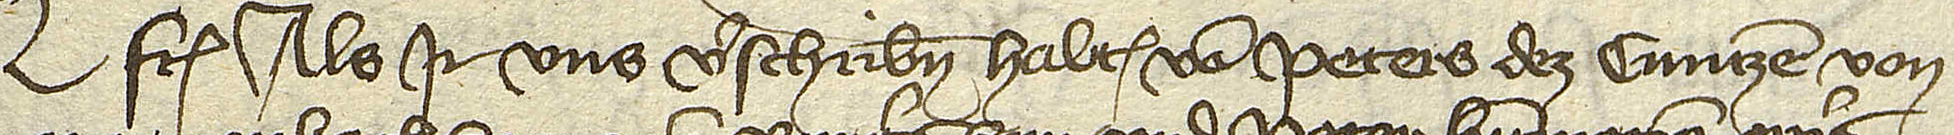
L* fr* Als Ir vns v*ſchribn* habt vo* Peters deʒ Cuncʒe* von
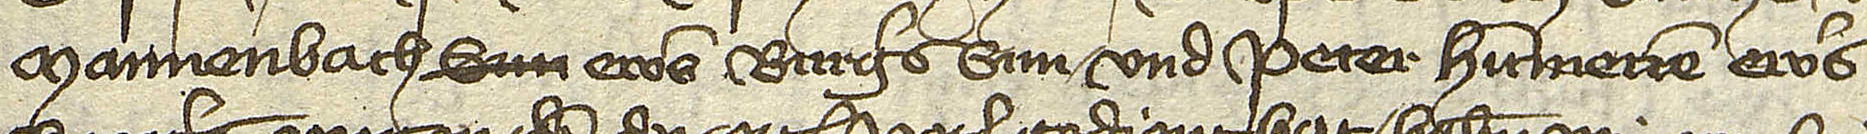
Mannenbach Sun ew*s Burg*s Sun / vnd Peter hu*mene* ew*s
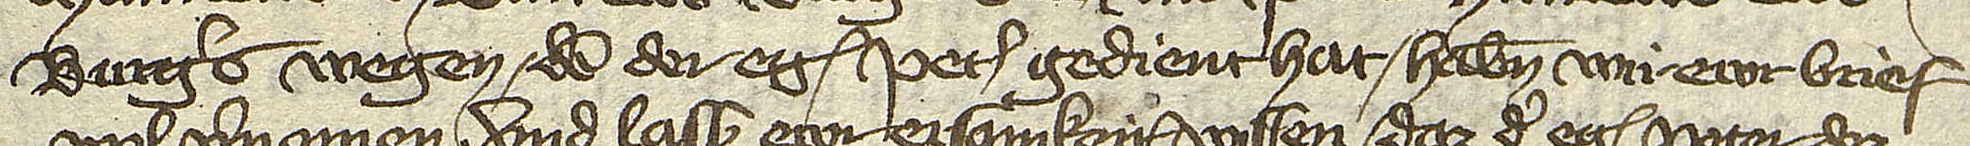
Burg*s wegen / d* der eg* Pet* gedient hat / habn* wir ewr brief
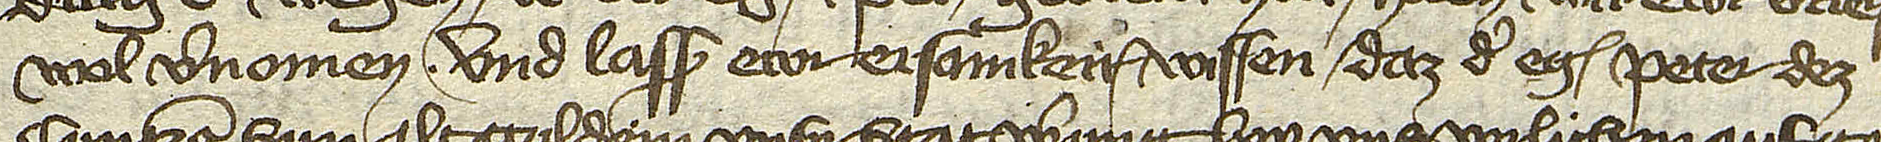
wol v*nomen . vnd laſſ* ewr erſamkeit* wiſſen / daʒ d* eg* Peter deʒ
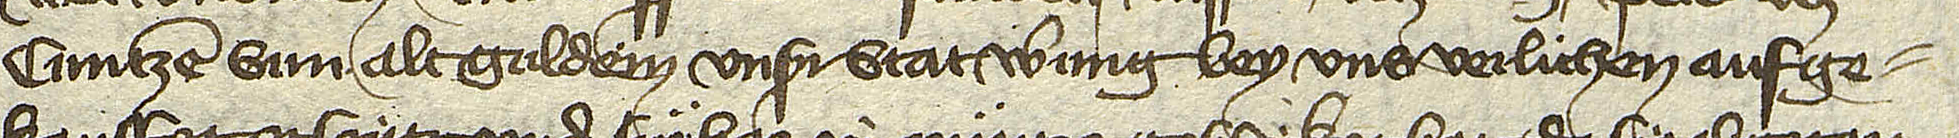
Cuncʒe* Sun alt geldern vnſ*r Stat w*ung bey vns verlichen aufge =
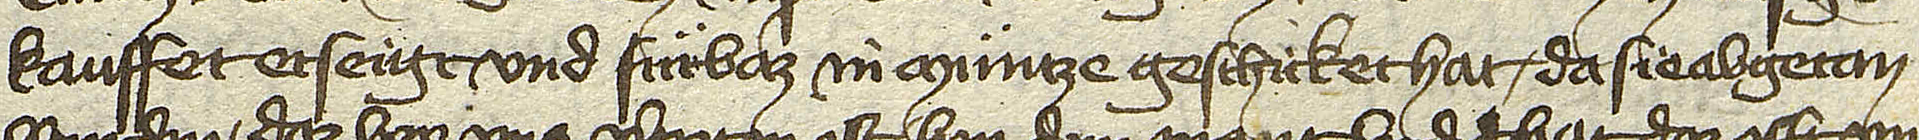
kauffet erſeigt vnd fürbaʒ in Müncʒe geſchicket hat / da ſie abgetan
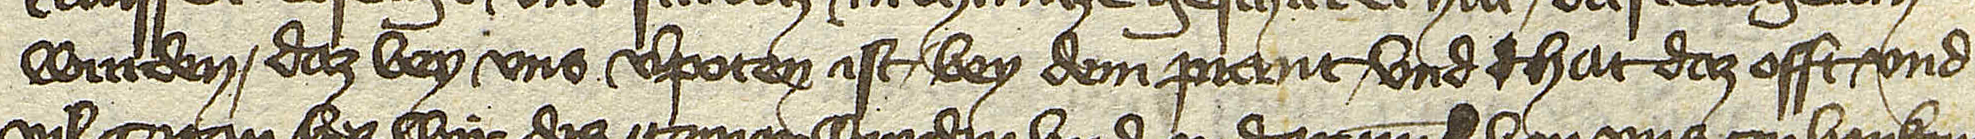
wurden / daʒ bey vns v*poten iſt / bey dem prant / vnd d hat daʒ offt vnd
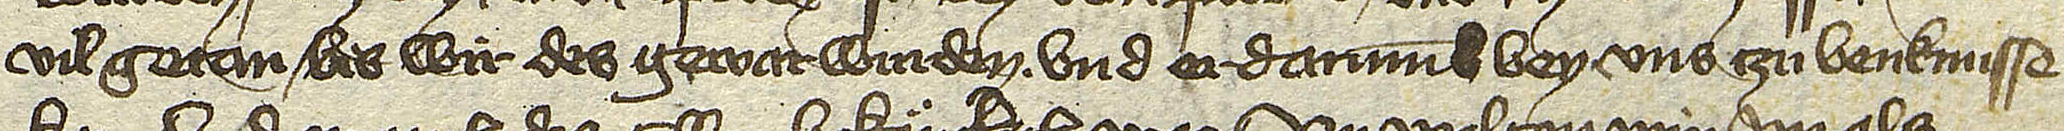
vil getan / bis wir des gewar wurden . vnd er darumb bey vns cʒu venknuſſe
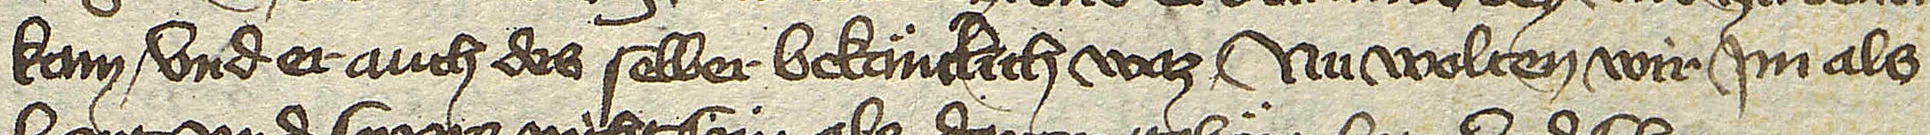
kam / vnd er auch des ſelber bekäntlich waʒ / Nu wolten wir Im als
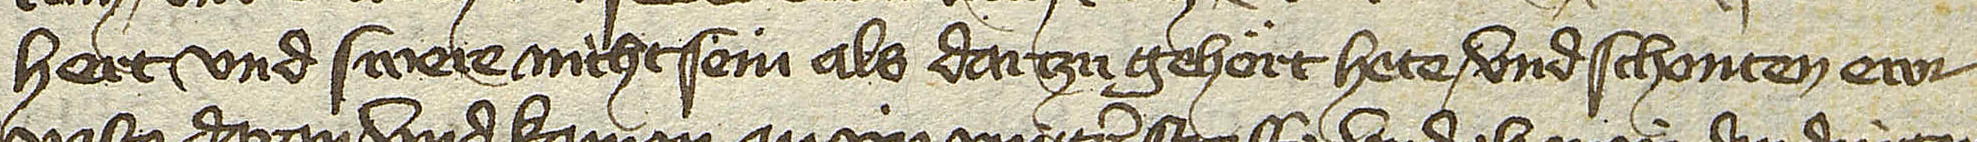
hert vnd ſwere nicht ſein als darcʒu gehört hete / vnd ſchonten ewr
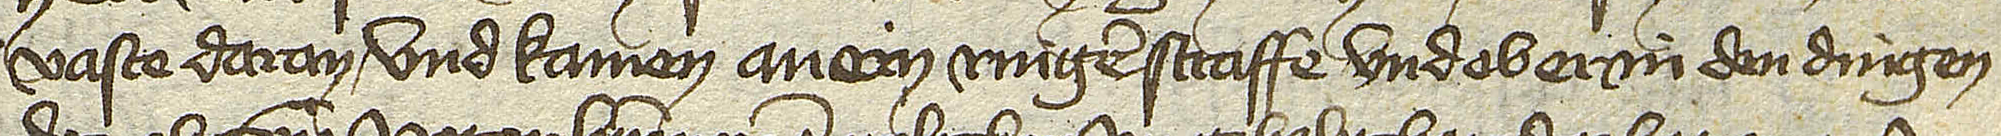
vaſte daran / vnd kamen an ein ringe* ſtraffe vnd ob er in den dingen
